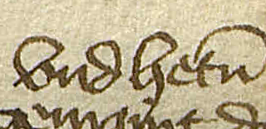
vnd hetn*
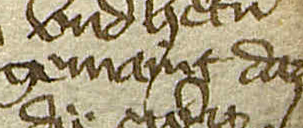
gemaint daʒ
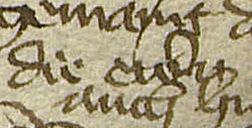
die ew*n
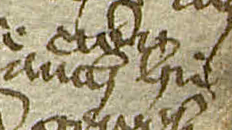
auch hie
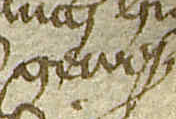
geweſ*
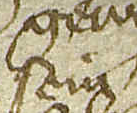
ſein
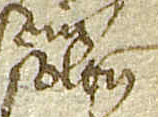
ſoltn*
